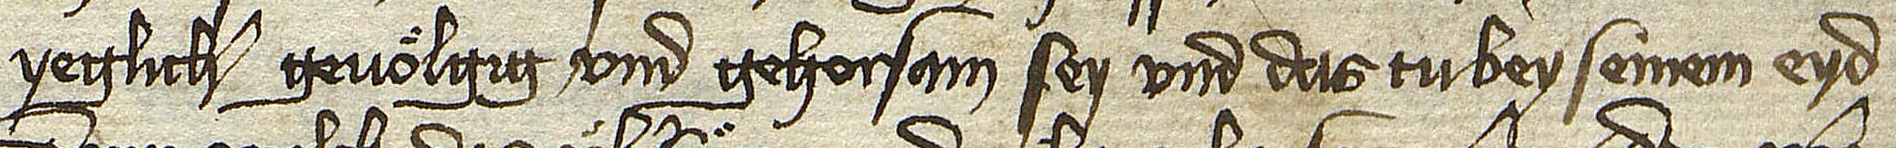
yeglich* geuölgig vnd gehorſam ſey vnd das tu bey ſeinem eyd
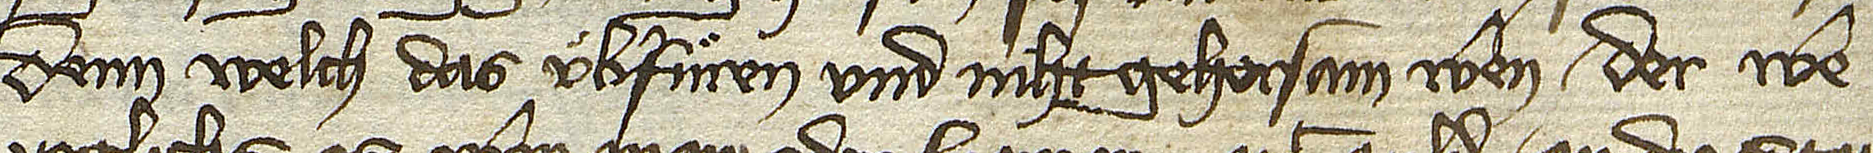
Denn welch das v̈bfüren vnd niht gehorſam w*en / der we*
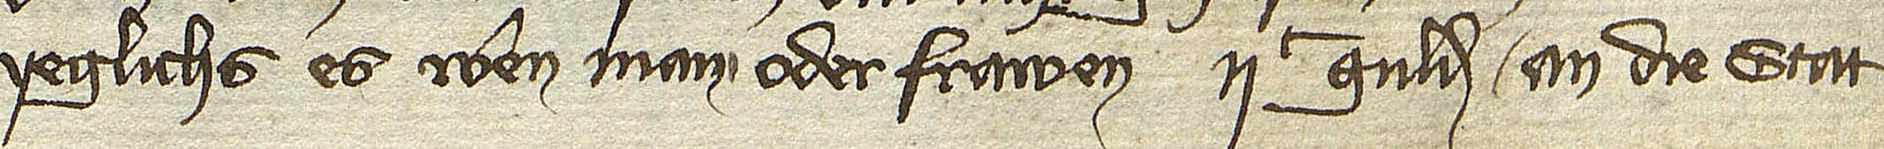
yeglichs es we*n man . oder frawen ii* guld* / an die Stat
